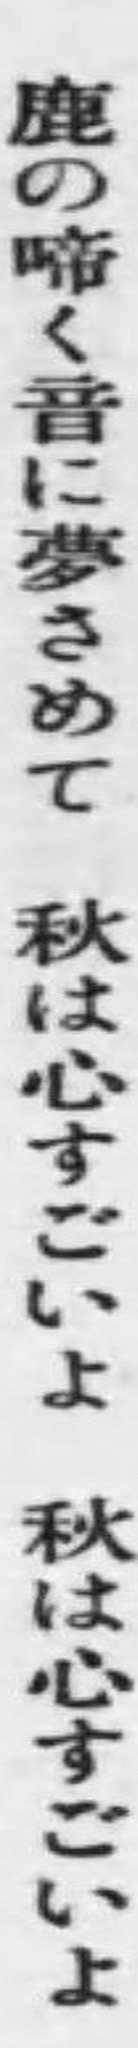鹿の啼く音に夢さめて秋は心すごいよ秋は心すごいよ
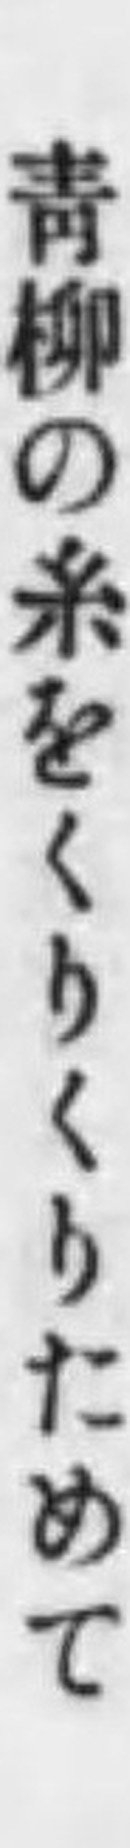青柳の糸をくりくりためて
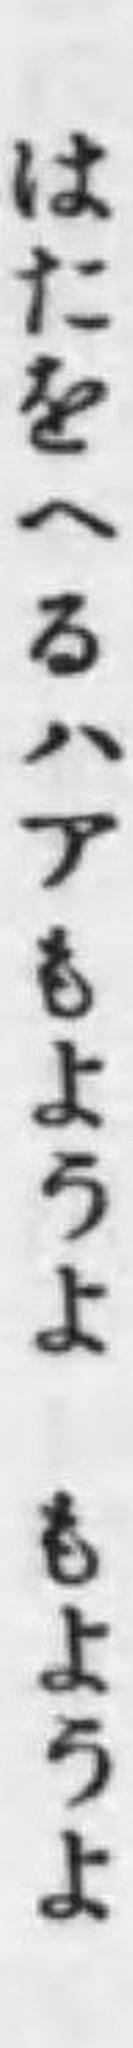はたをへるハアもようよもようよ

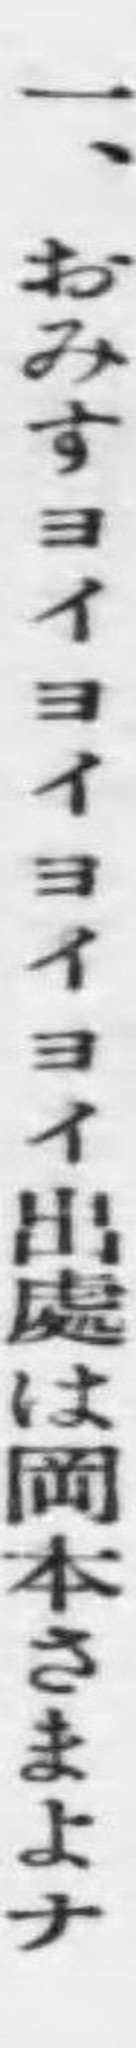一、おみすヨイヨイヨイヨイ出處は岡本さまよナ
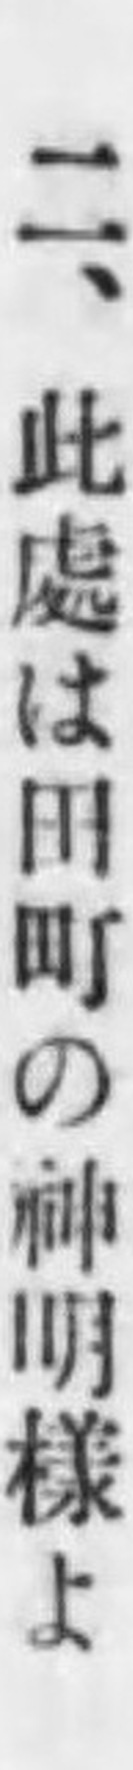二、此處は田町の神明樣よ
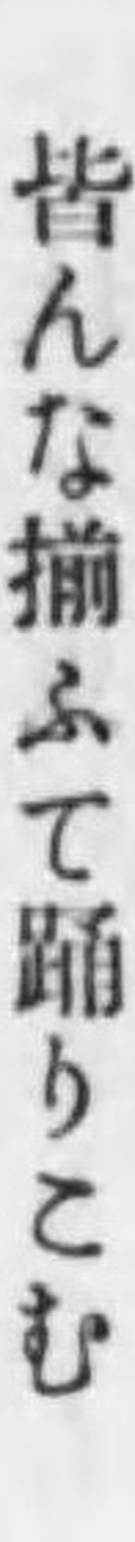皆んな揃ふて踊りこむ
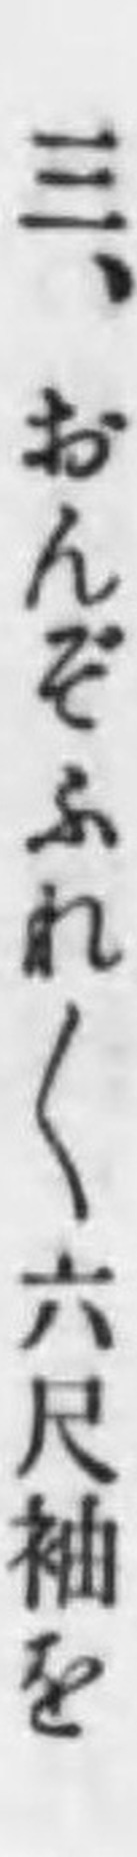三、おんぞふれ〳〵六尺袖を
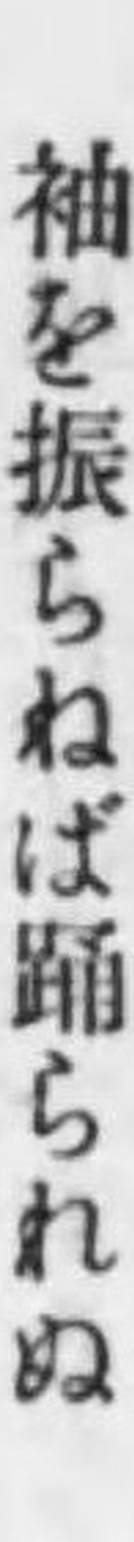袖を振らねば踊られぬ
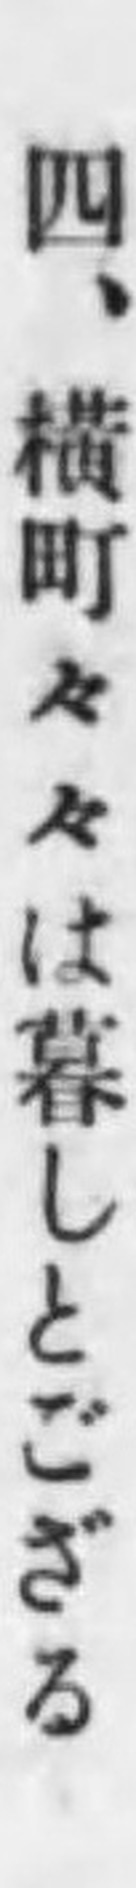四、橫町々々は暮しとござる
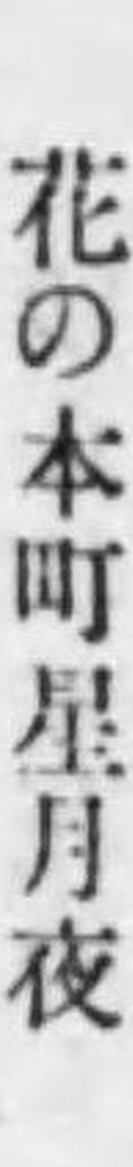花の本町星月夜
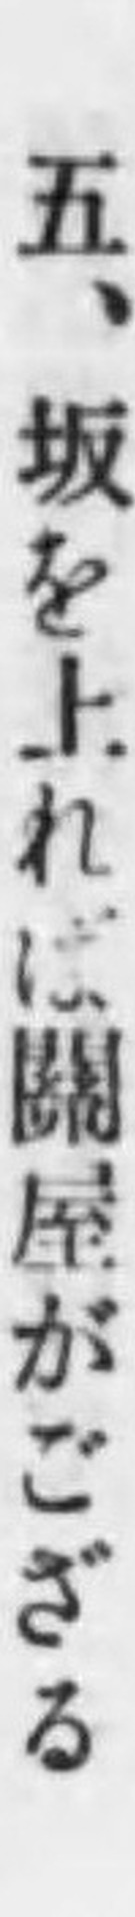五、坂を上れば關屋がござる
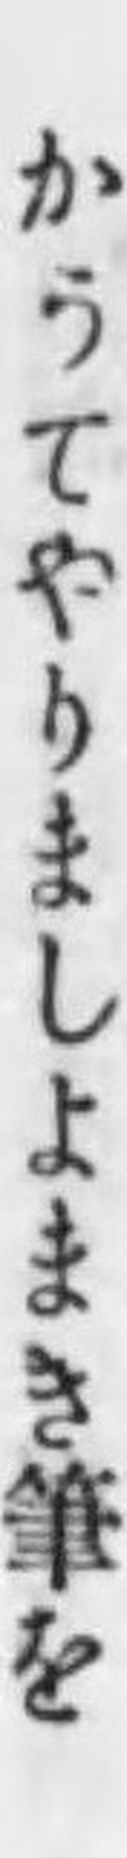かうてやりましよまき筆を
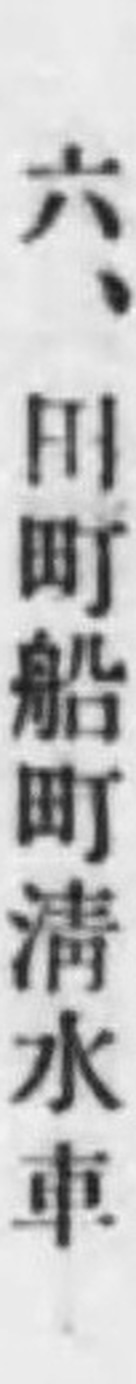六、田町船町清水車
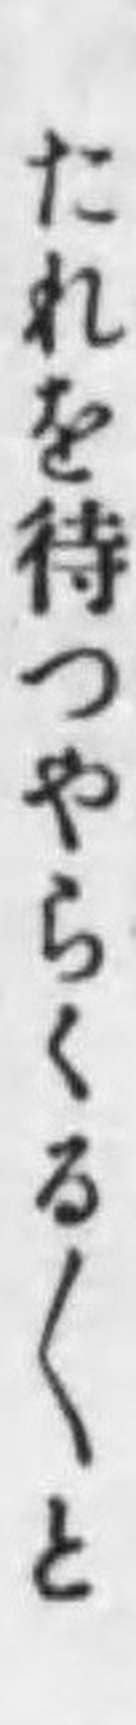たれを待つやらくる〳〵と
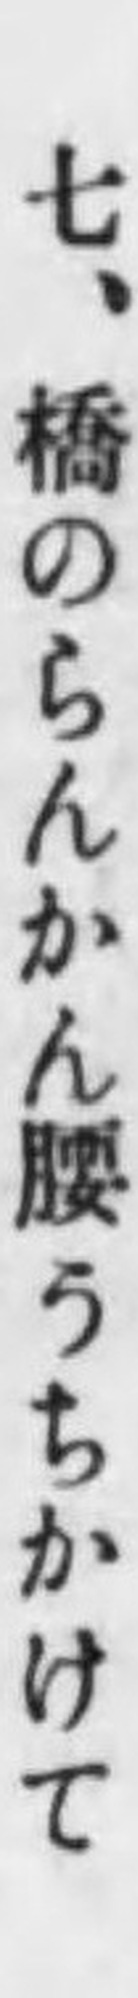七、橋のらんかん腰うちかけて
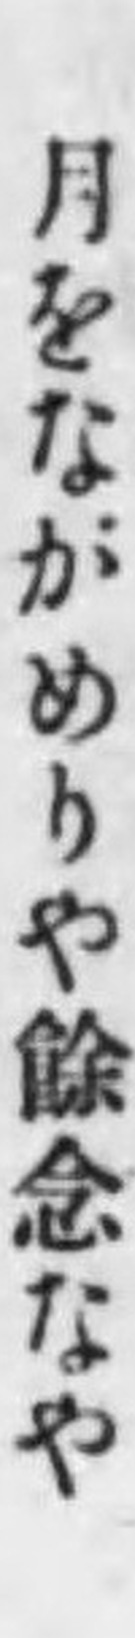月をながめりや餘念なや
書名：東三河道中記 : 豊橋市及其附近案内
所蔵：国立国会図書館 National Diet Library, JAPAN
